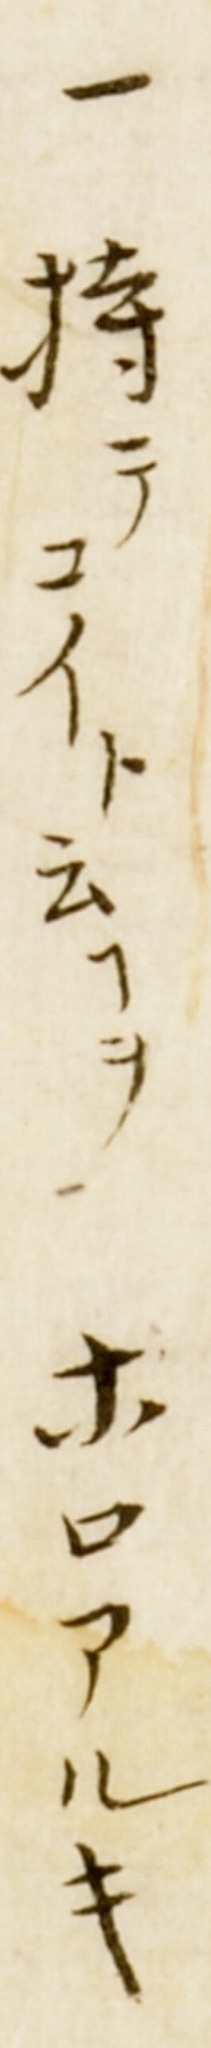一持テコイト云コトヲホロアルキ
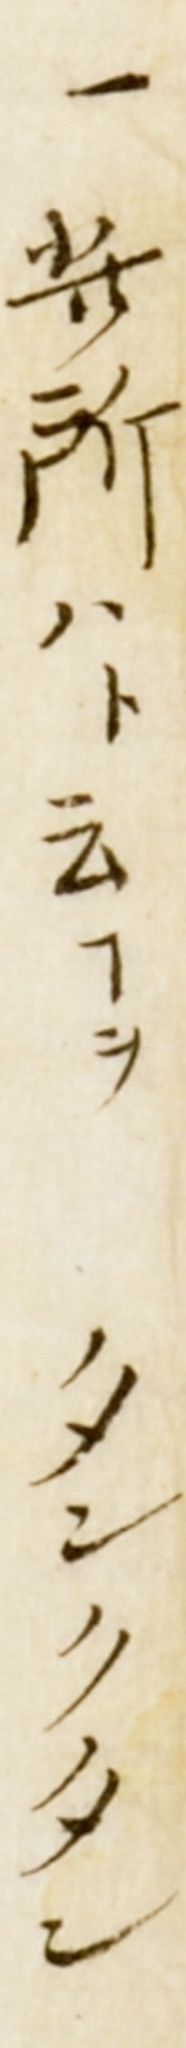一此所ハト云コトヲタンクタン

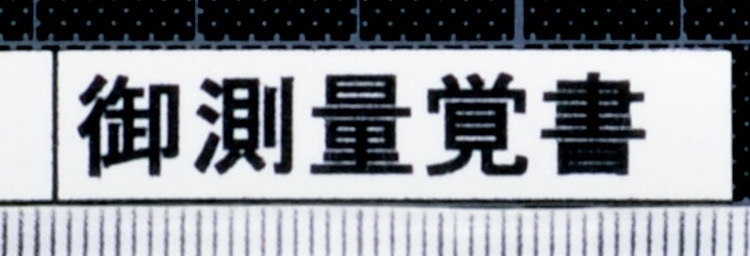御測量覚書
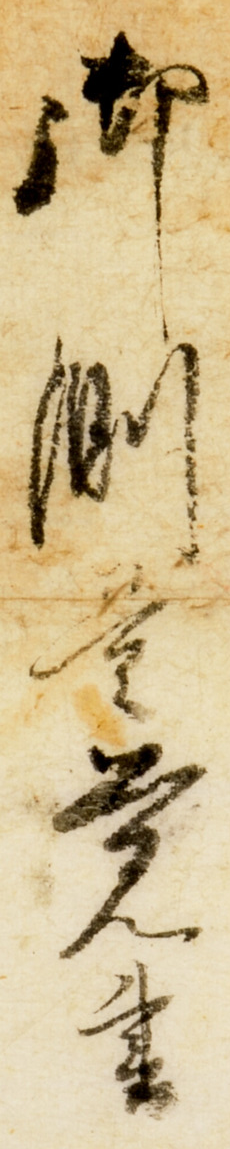御測量覚書
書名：御測量覚書
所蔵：伊那市立高遠町図書館・合同会社AMANE
